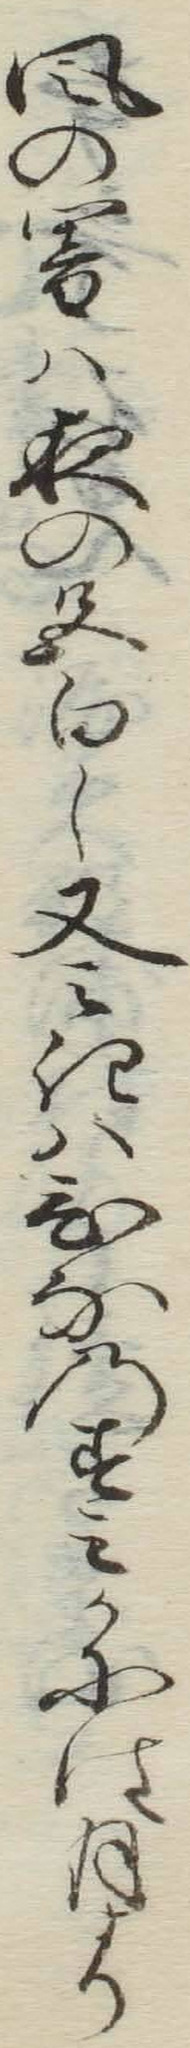風の闇は夜の色白し又みきはひなのすみかには月より
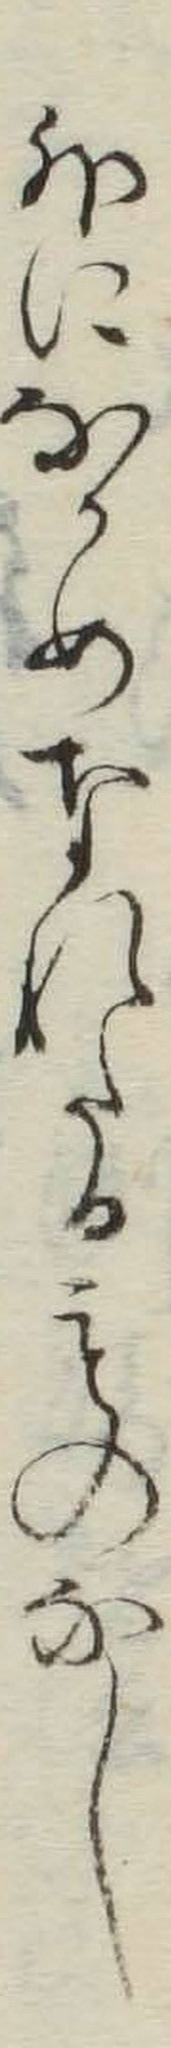外になかめなれたるものなし
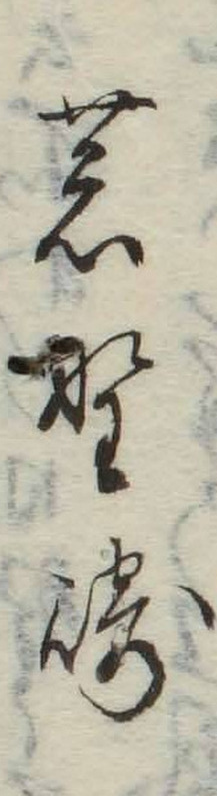荒野崎
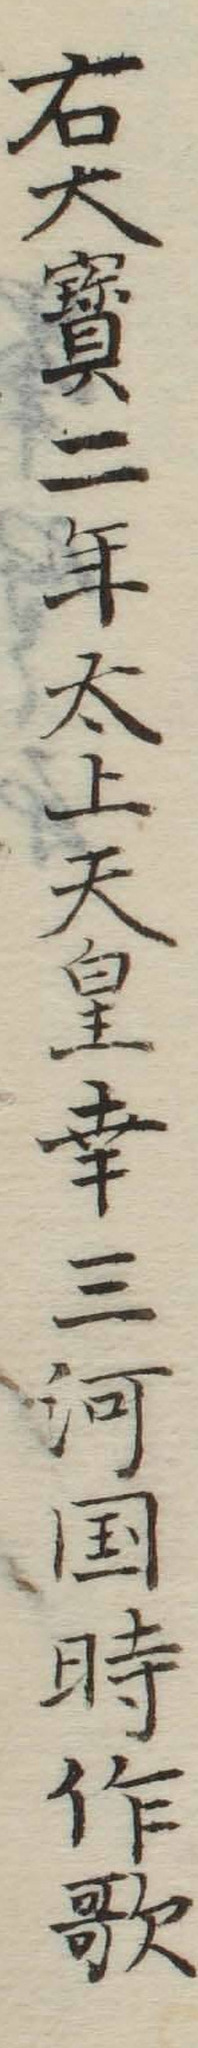右大宝二年太上天皇幸三河国時作歌

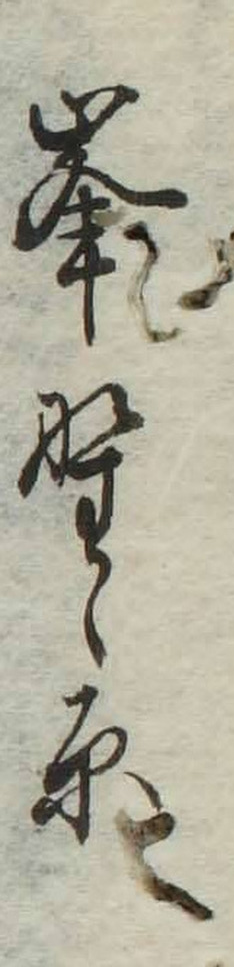峯野ゝ原
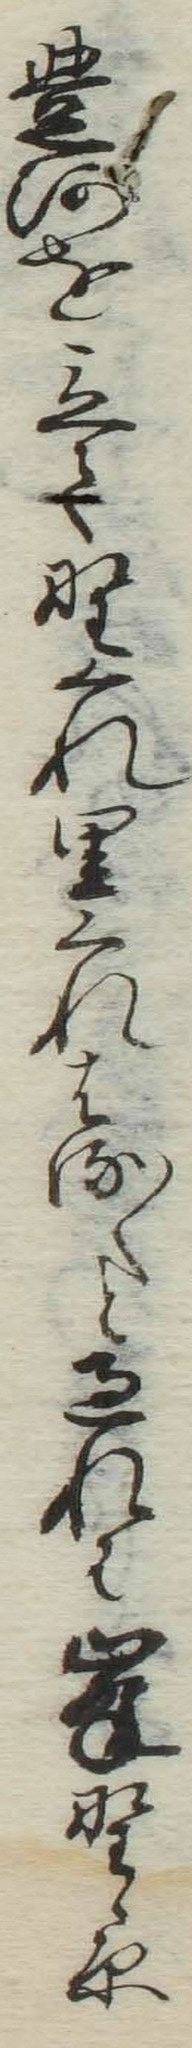豊河を立て野くれ里くれはる〳〵と過れは峯野々原
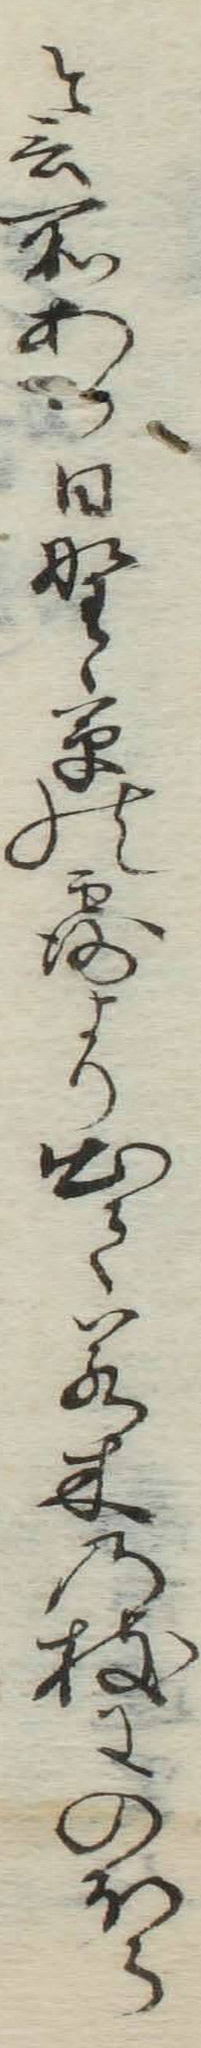と云所あり日野ゝ草の露より出て若木の枝にのほら
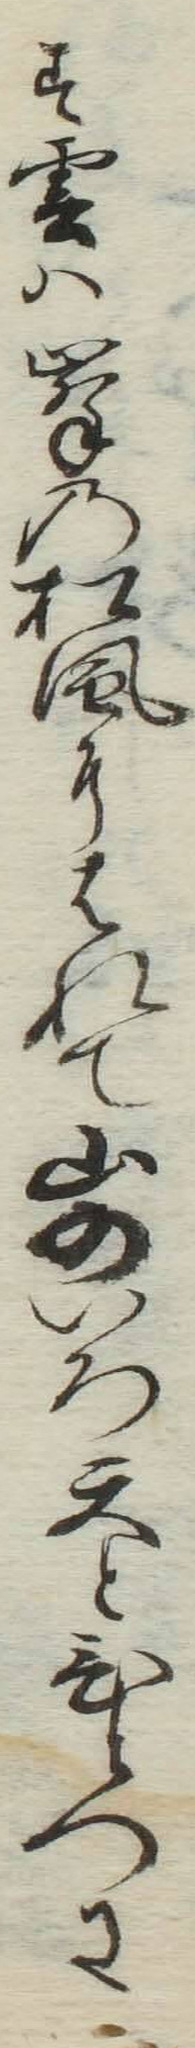す雲は峯の松風にはれて山のいろ天とひとつに
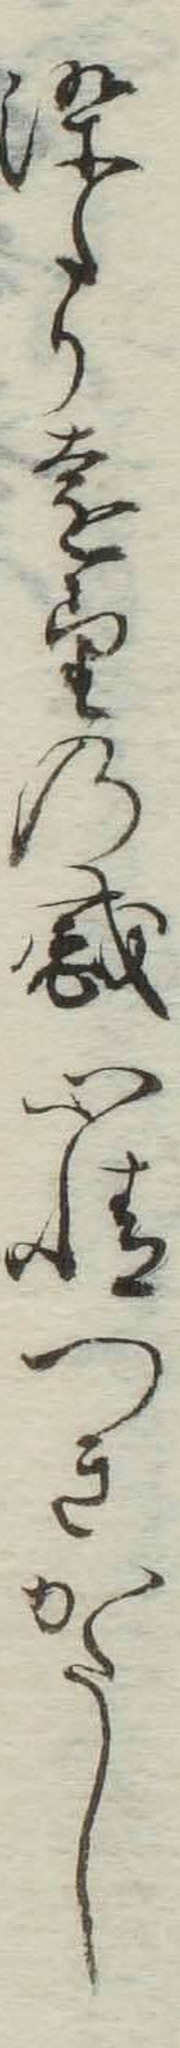染たり遠望の感心情つきかたし
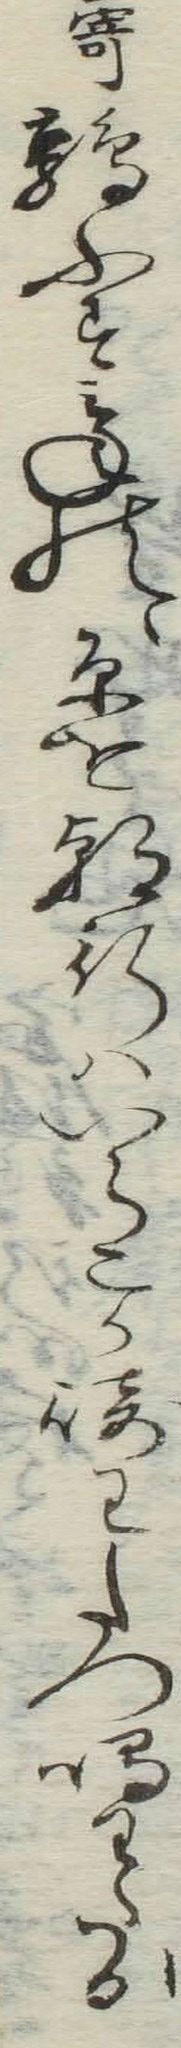名寄鶉ふすみねのゝ原を朝行はいらこか崎わたつ鳴わたる同
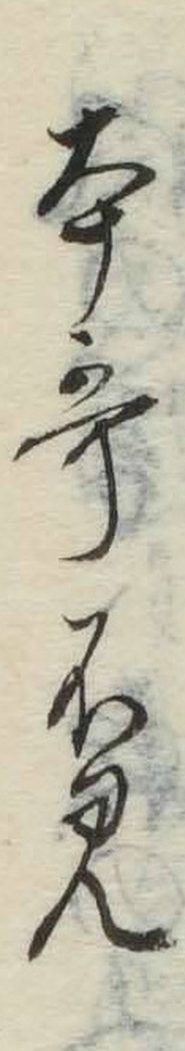本歌不見
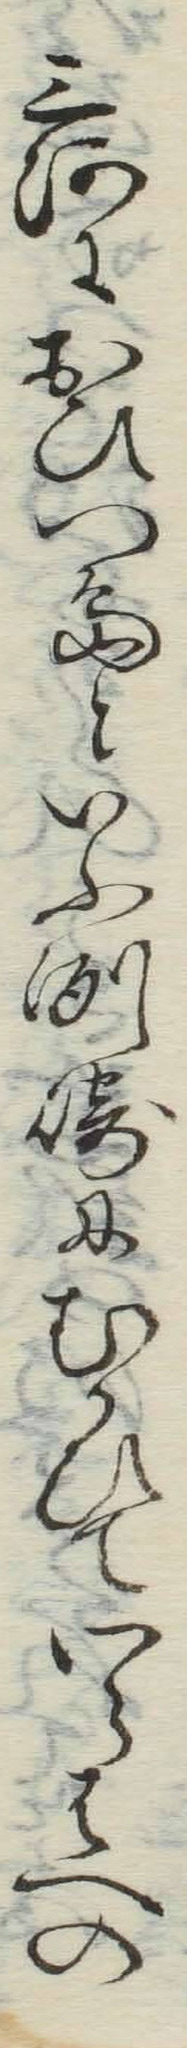三河におひつ島といふ州崎にむかひてわらはへの
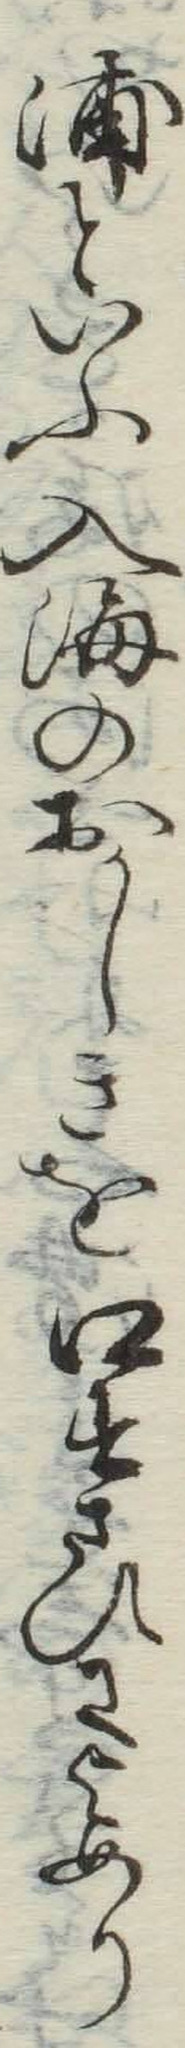浦といふ入海のおかしきを口すさひによめり
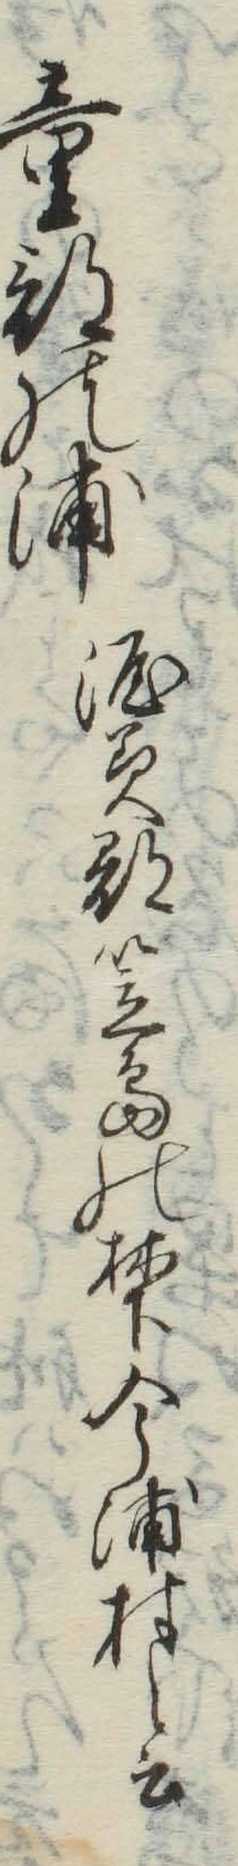童郡の浦渥美郡笠島の麓今浦村と云

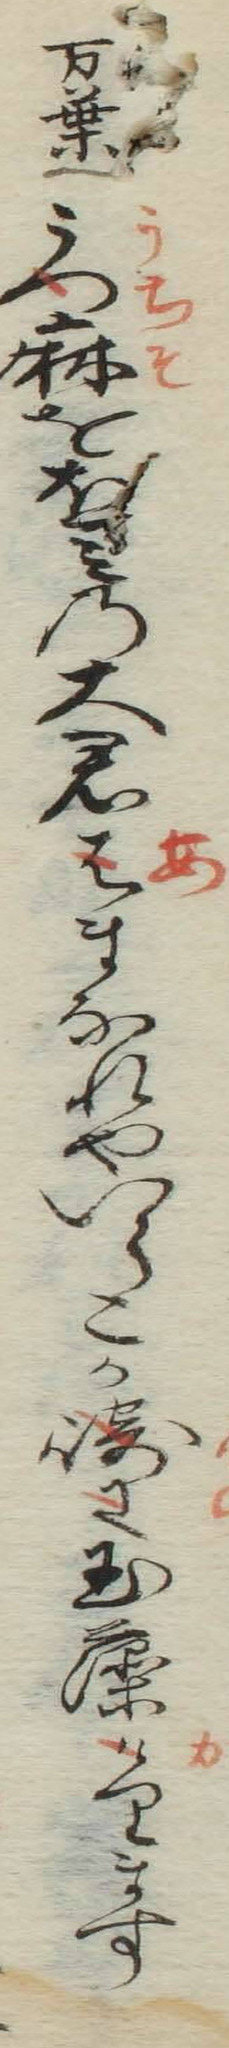万葉うつ麻ををみの大君はまなれやいらこか崎に玉藻けります
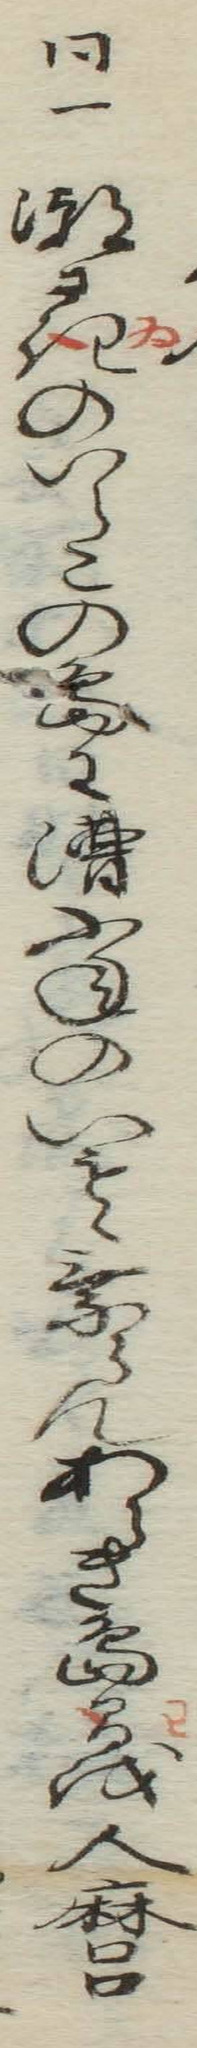同一潮さきのいらこの島に漕ふねのいもゝ乗らんあらき島まを人麻呂
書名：三河国二葉松
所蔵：国文学研究資料館
